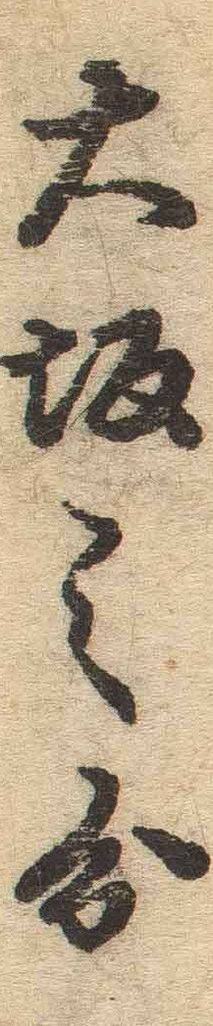大坂之分

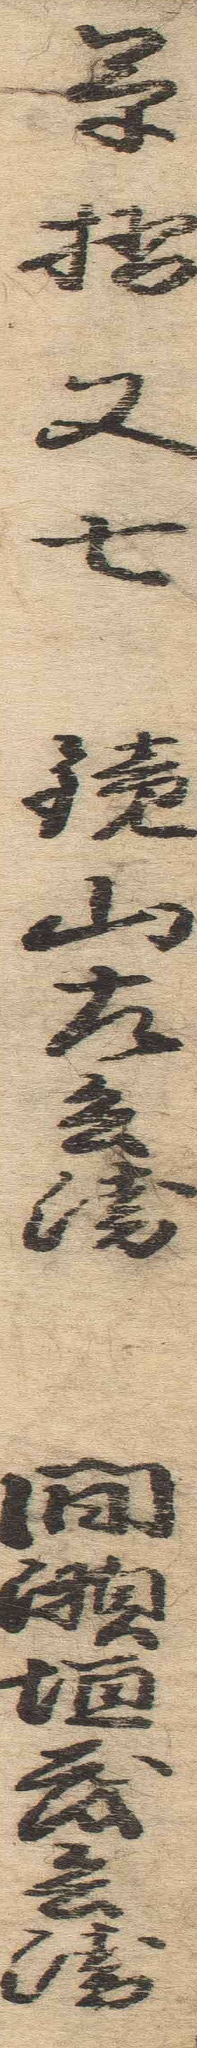早摺又七鏡山左兵衛間瀬垣武兵衛
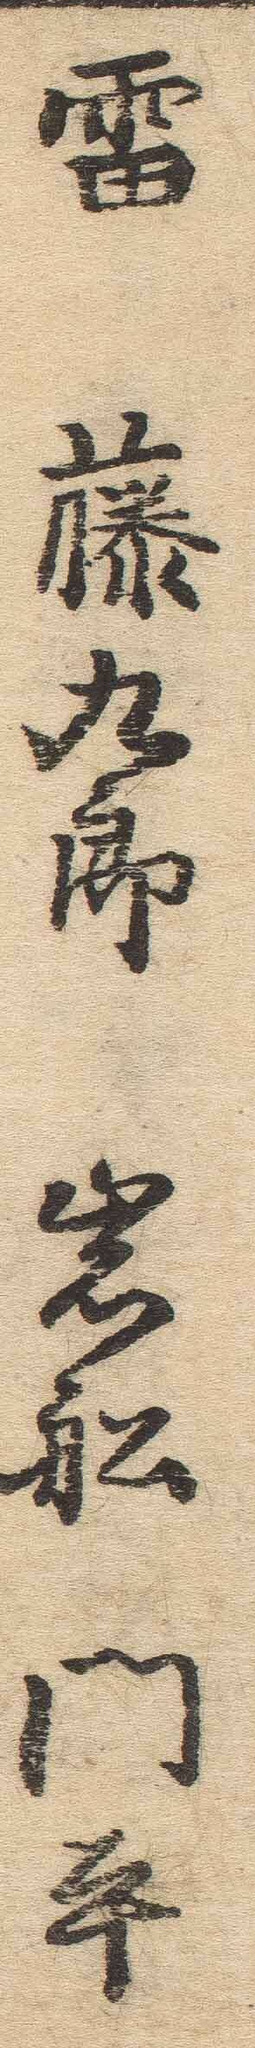雷藤九郎岩船門平
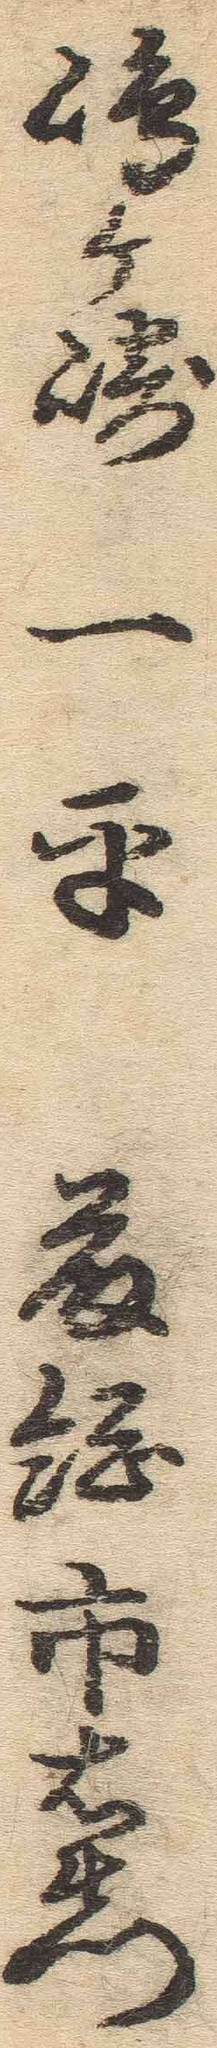嶋ケ崎一平藤綱市右衛門
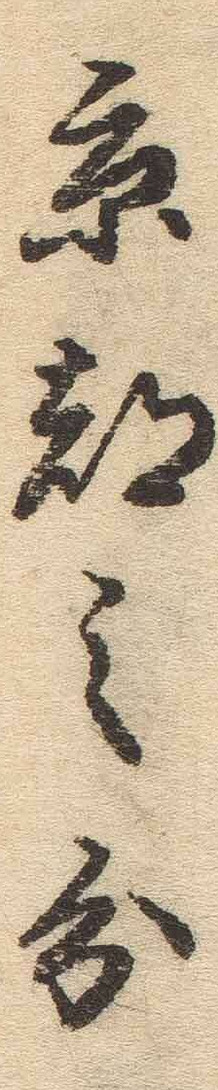京都之分
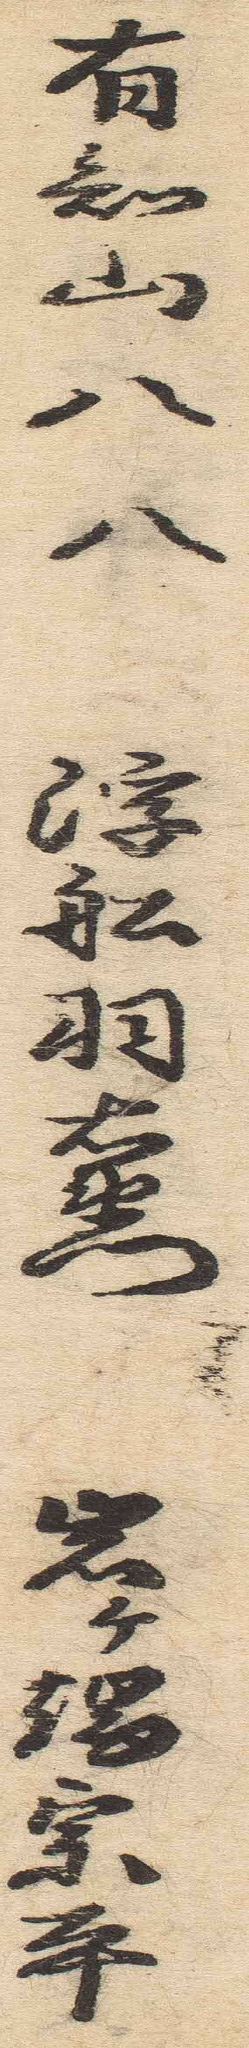有知山八八浮船羽右衛門岩ケ端宗平
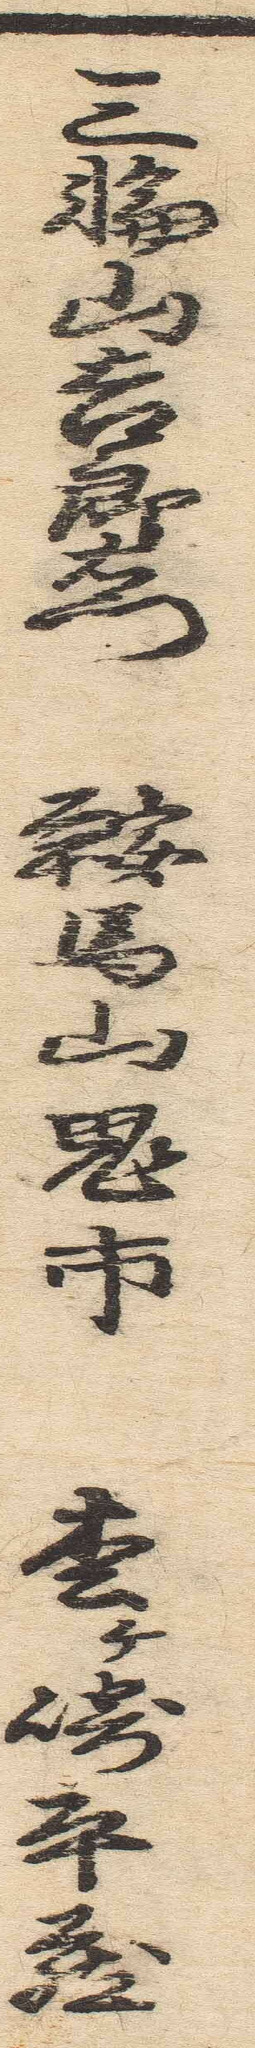三輪山吉郎右衛門鞍馬山鬼市松ケ崎平蔵
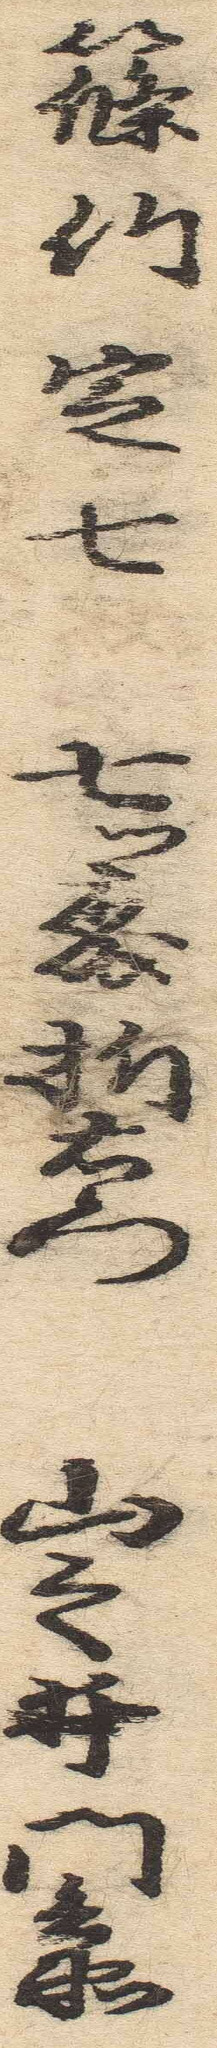篠竹定七七ッ森折右衛門山之井門兵衛
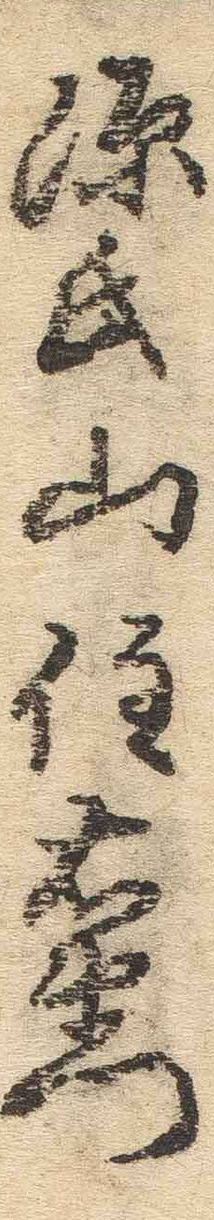源氏山住右衛門
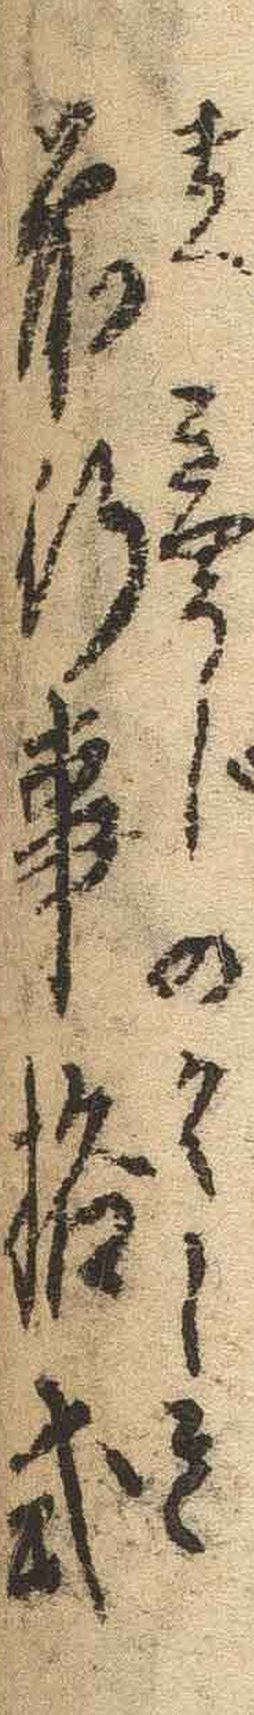前行事格式
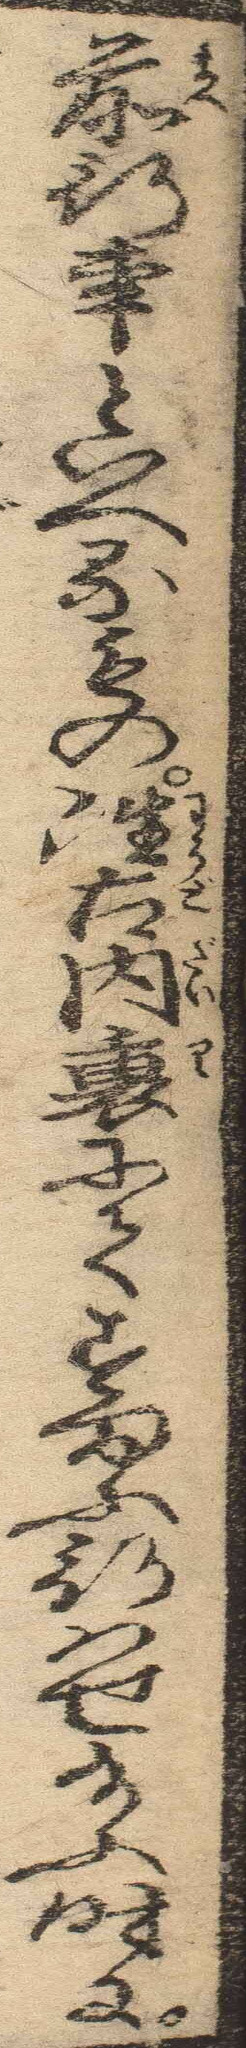前行事といへるもの。往古内裏にてすまふ行はせ給ふ時に。
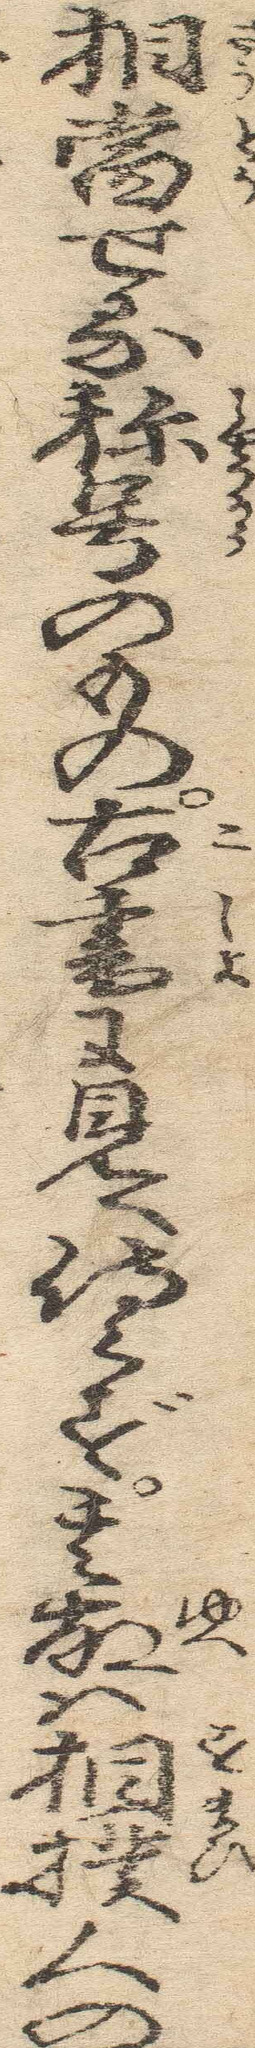相当せる称号のもの。古書に見え侍らず。其故は相撲人の
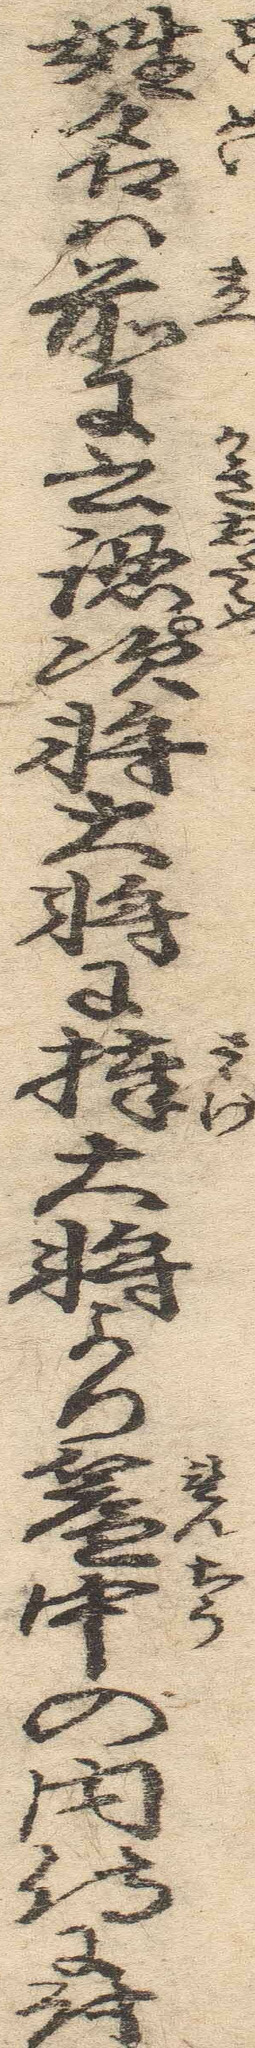姓名は前に書認。次将大将に捧大将より簾中の内侍に付
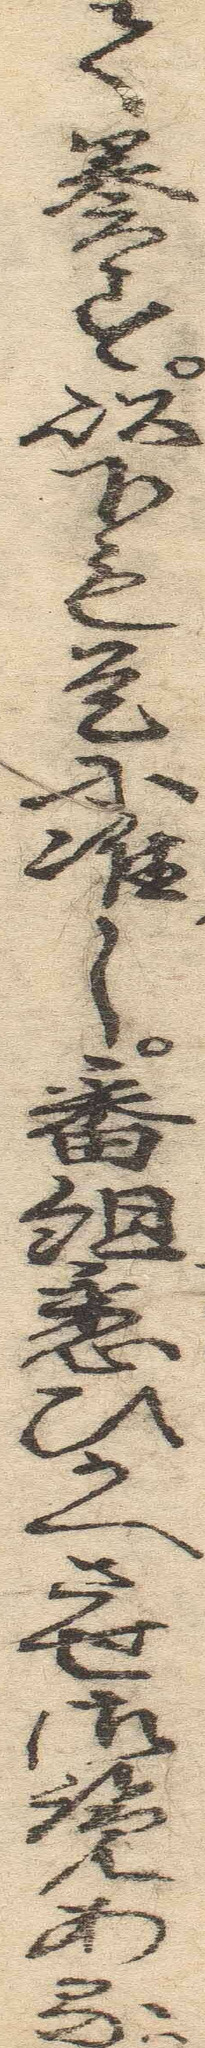て奏す。以下も是に准し。番組悉ひかへさせ御覧ある。
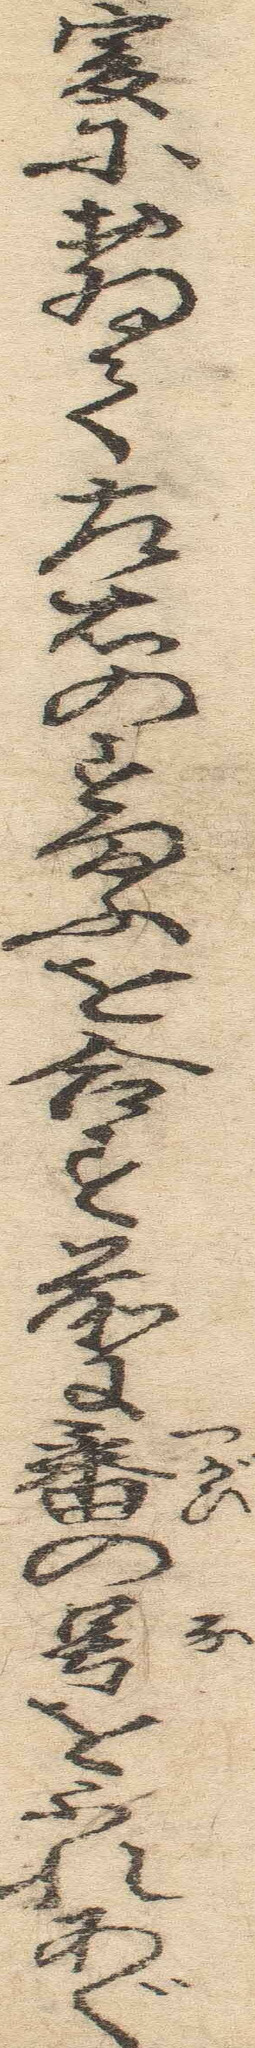爰におゐて左右のすまふを合す前に番の号をふれあぐ
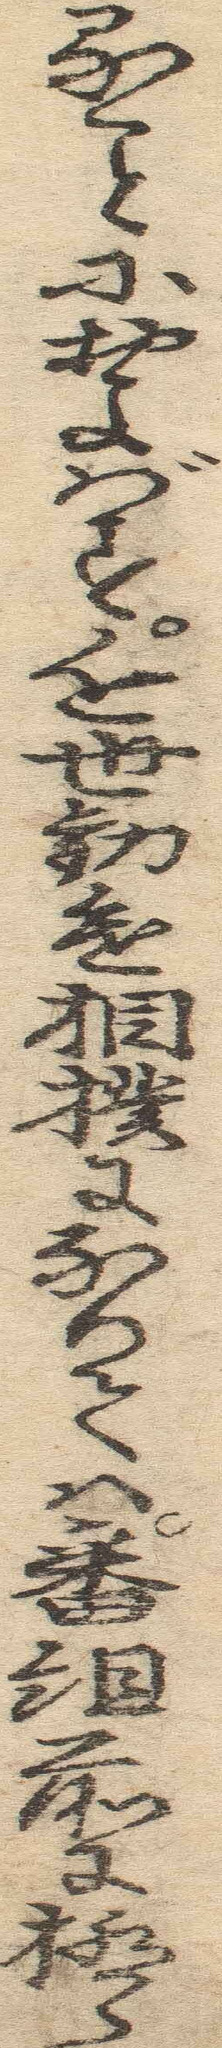ることにおよばす。近世勧進相撲になりては。番組前に極ら
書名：古今相撲大全
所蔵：東京学芸大学附属図書館 国文学研究資料館
